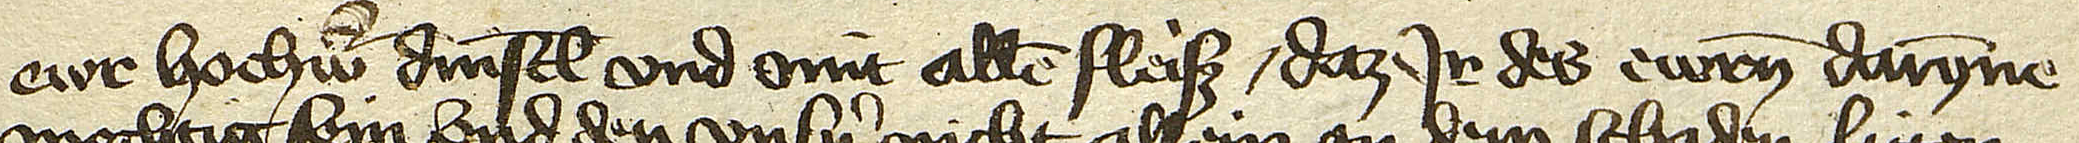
ewr hochw* dinſtl* vnd mit alle* fleiſʒ / daʒ des ewrn* daryne*
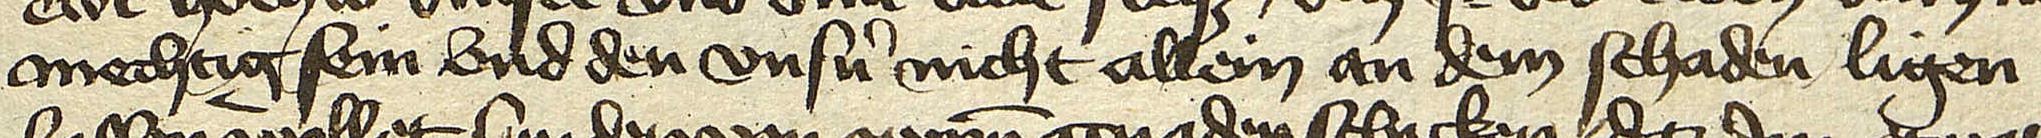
mechtig ſein vnd den vnſn* nicht allein an dem ſchaden ligen
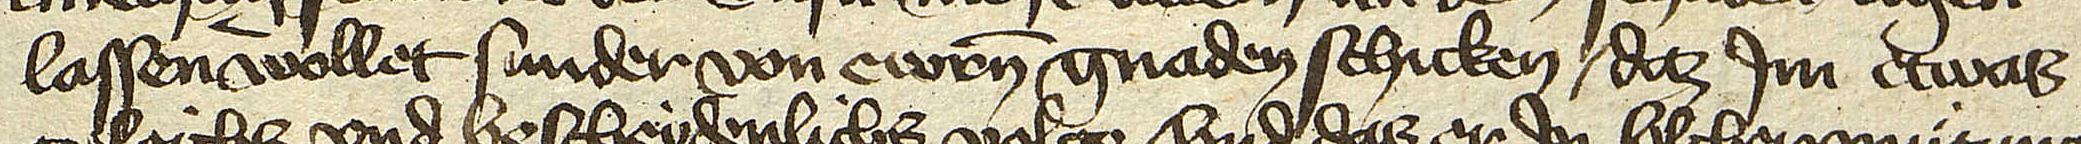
laſſen wollet ſunder von ewrn* gnaden ſchicken / daʒ Im etwas
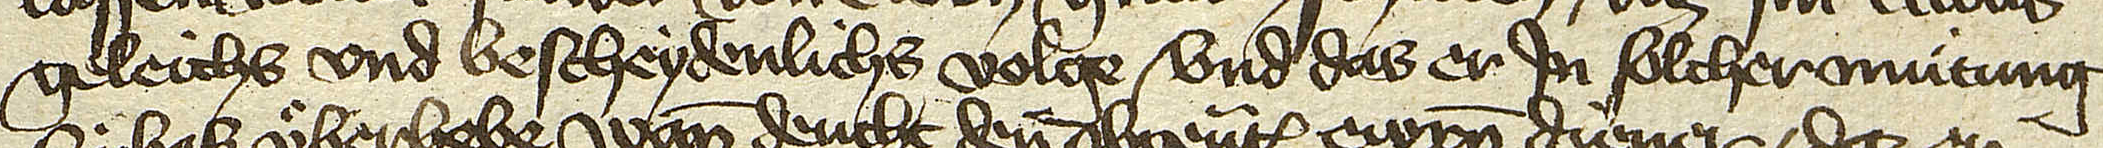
geleichs vnd beſcheydenlichs volge / vnd das er In ſolcher mütung
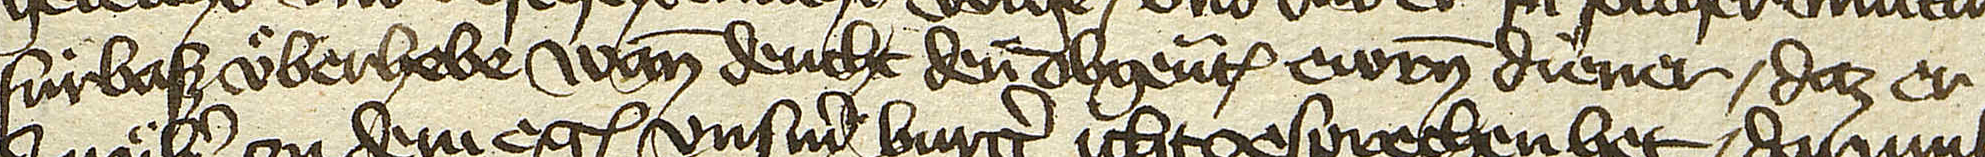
fürbaſʒ v̈berhebe wan* deucht den obgent* ewrn* diener / daʒ er
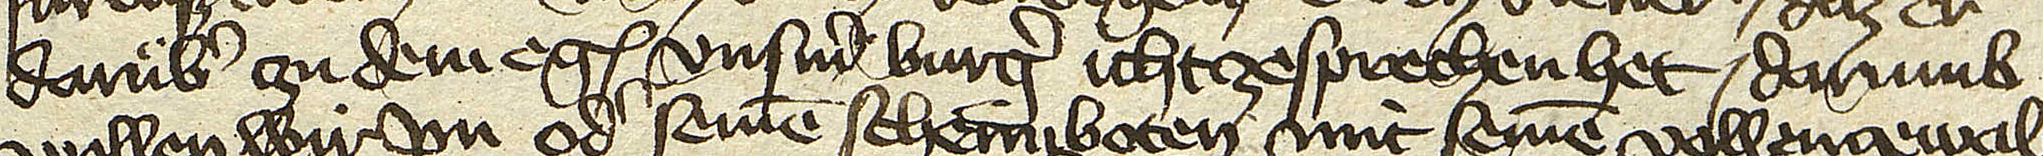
darüb* cʒu dem eg* vnſm* burg* icht cʒeſprechen het / darumb
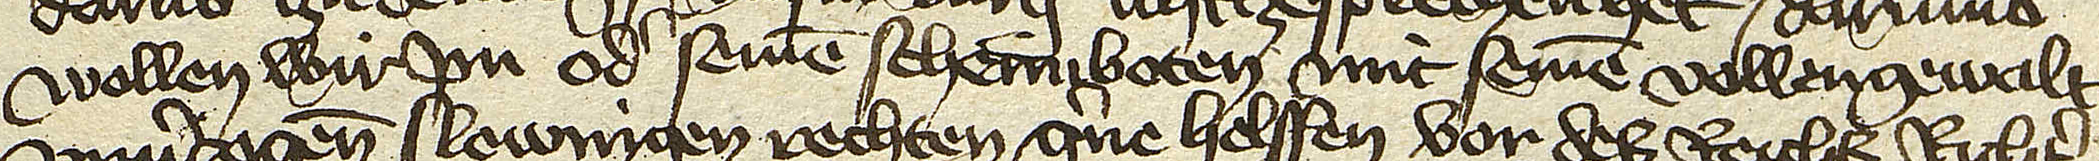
wollen wir Im od* ſeine* ſchemiboten mit ſeine* vollen gewalt
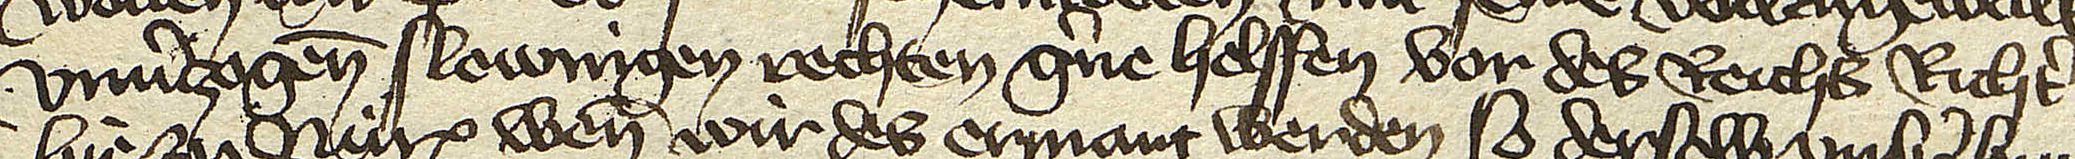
vnu*cʒogen* ſlewnigen rechten g*ne helffen vor des Reichs Richt*
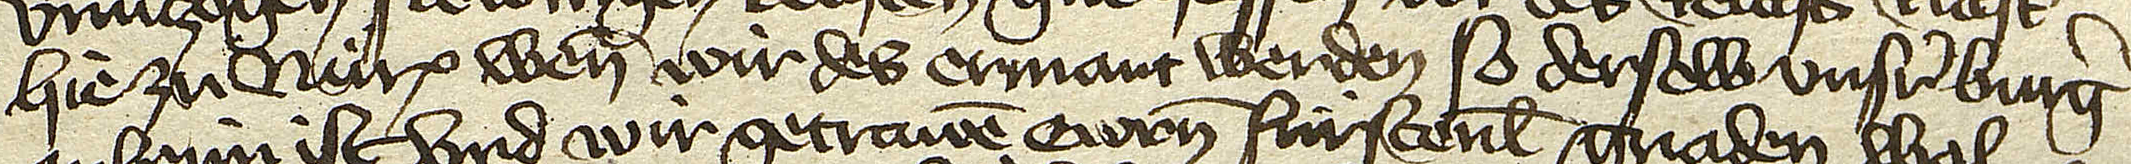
hie cʒu Nür* wen* wir des ermant werden ſo derſelb* vnſr* burg*
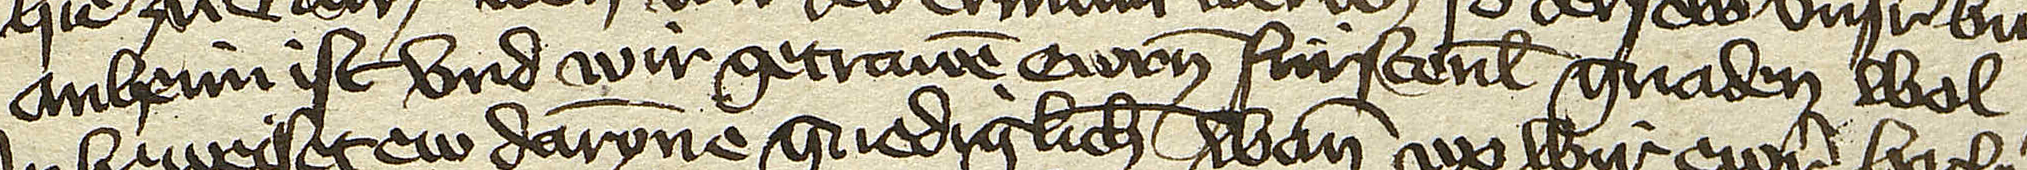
anheim iſt vnd wir getrawe* ewrn* fürſtenl* gnaden wol
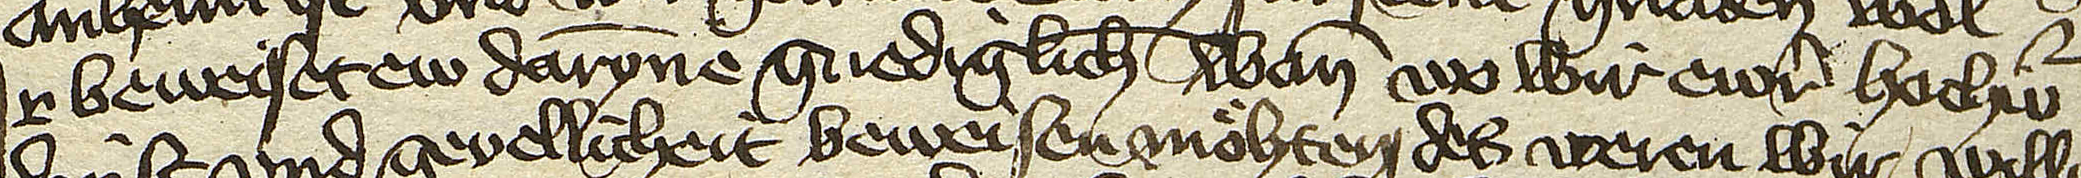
Ir beweiſet ew daryne* gnediglich* wan* wo wir ewr* hochw*
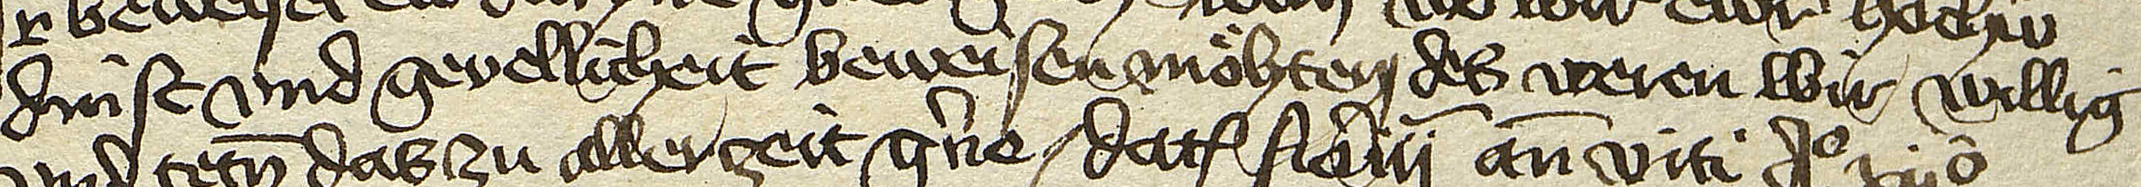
dinſt vnd gevellicheit beweiſen möhten des weren wir willig
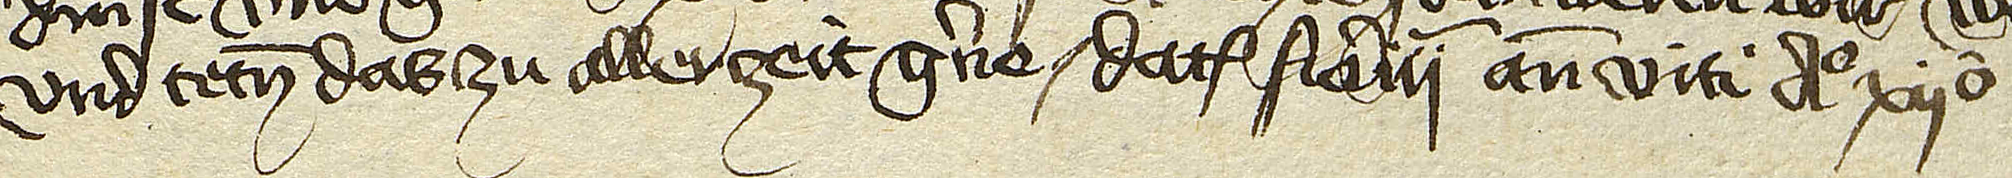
vnd tetn* allercʒeit g*ne / dat* fia* iii* an* viti A* xii*
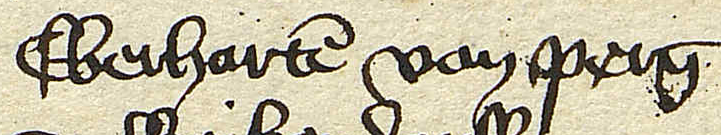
Eberharte* von perg
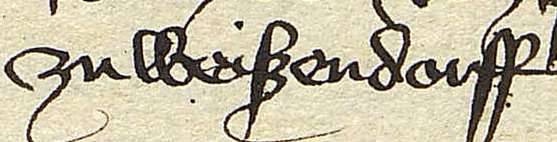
cʒu weiſʒendorff
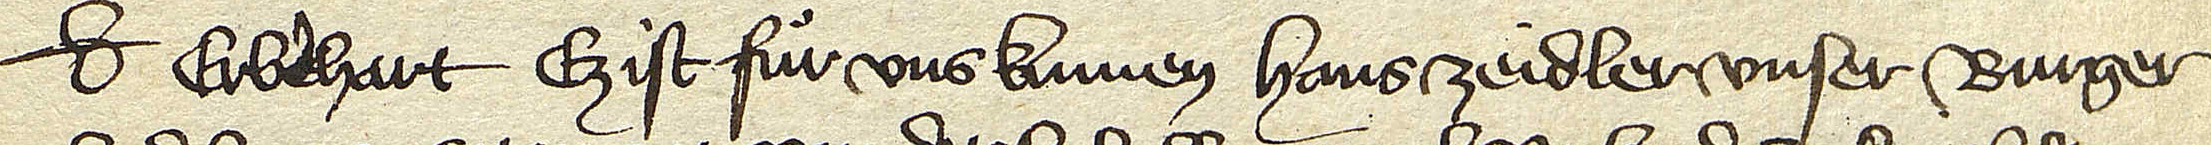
L* Eb*hart Eʒ iſt für vns kumen hans cʒeidler vnſer Burger
